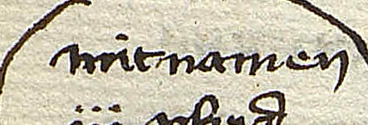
mitnamen
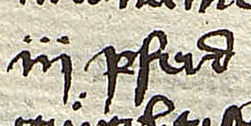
iii pferd
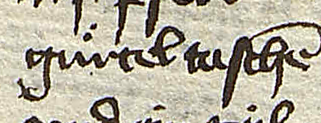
gürtel taſche*
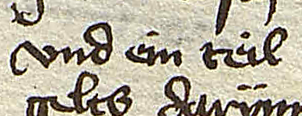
vnd ein teil
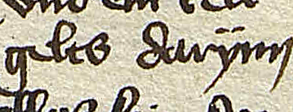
gelts darynn
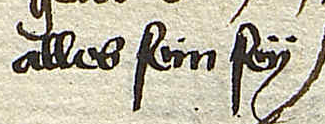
alles ſein ſey
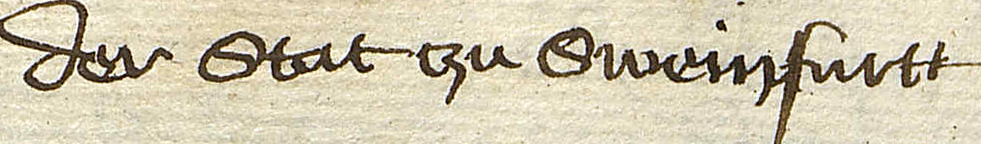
Der Stat cʒu Sweinfurtt
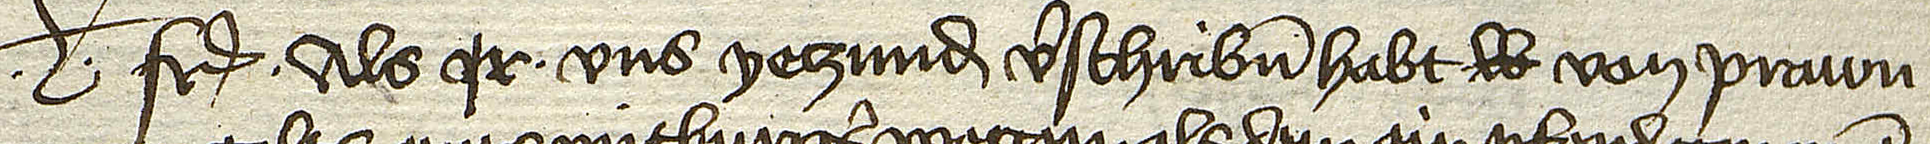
L* fr* . Als Ir . vns yecʒund* v*ſchrib*n habt w von prawn
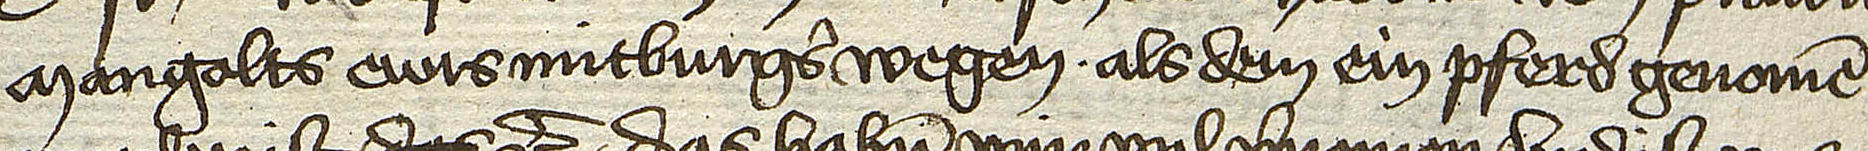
Mangolts ewrs mitburg*s wegen . als dem ein pferd genome*
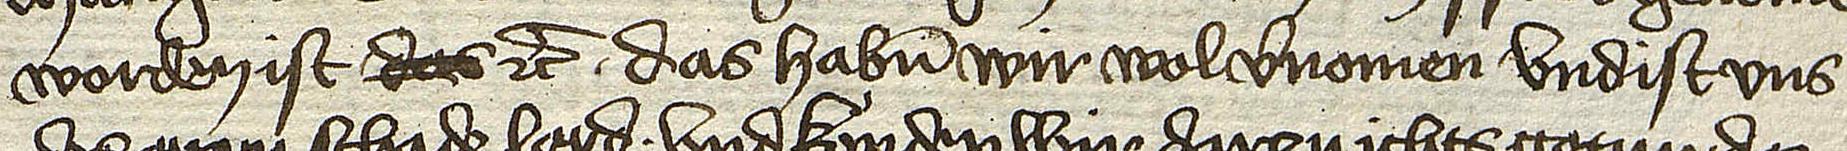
worden iſt das ec* / das hab*n wir wol v*nomen / vnd iſt vns
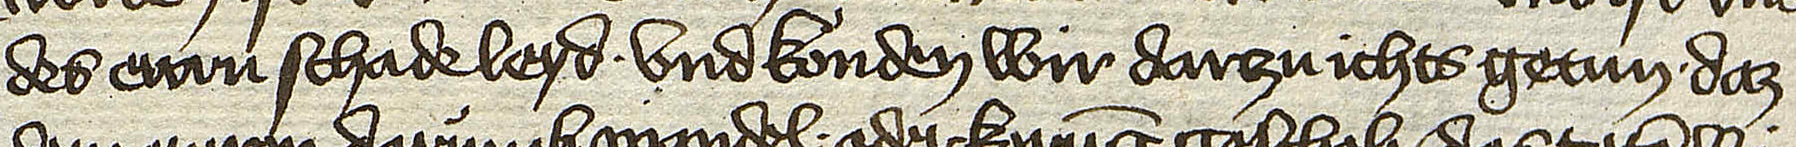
des ewrn ſchade leyd . vnd könden wir darcʒu ichts getun . daʒ
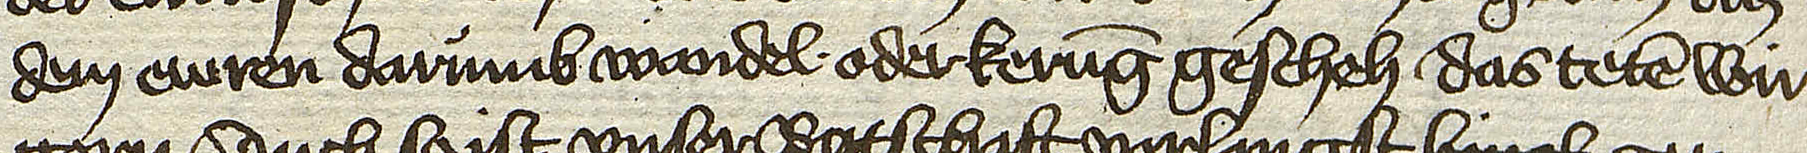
dem ewren darümb wandel . oder keru*g geſcheh / das tete* wir
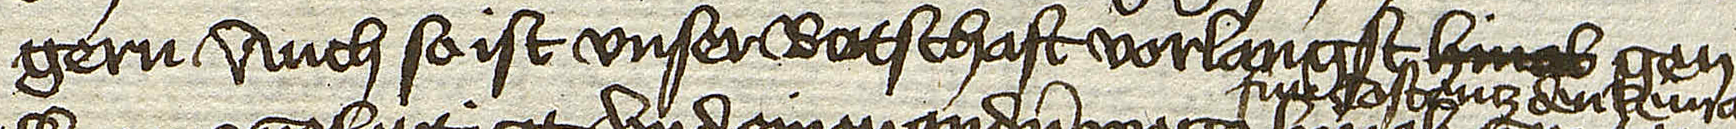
gern / Auch ſo iſt vnſer Botſchaft vorlangſt hinab gen
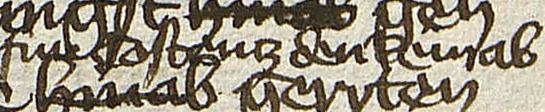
fur Coſtencʒ den Rein ab
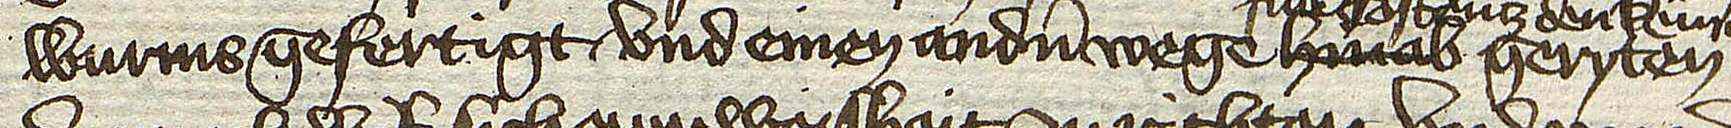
Wurms gefertigt / vnd einen and*n wege hinab geryten
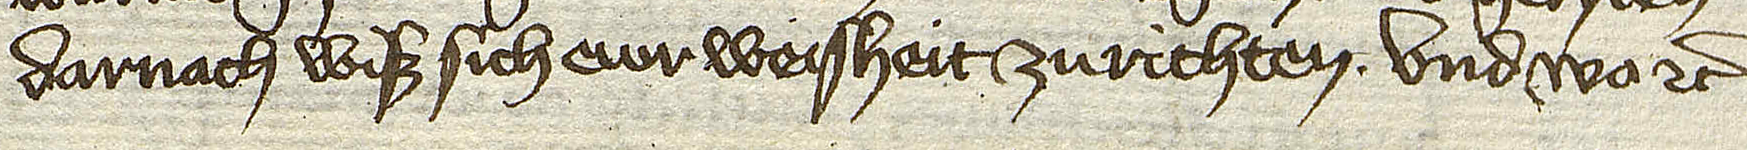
darnach wiſʒ ſich ewr weiſheit cʒurichten . Vnd wo ec*
